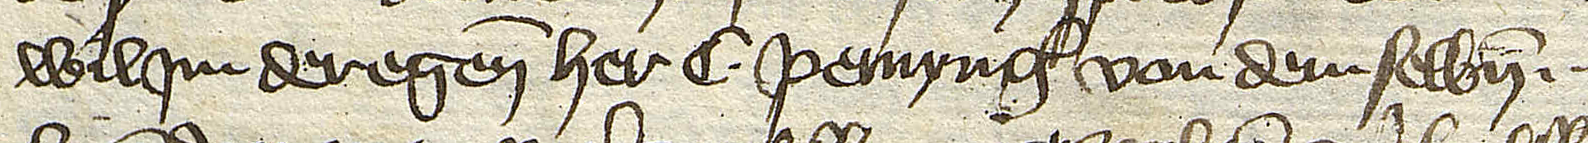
wil Im der egen* her C . Peinyng* von demſelbn* ~
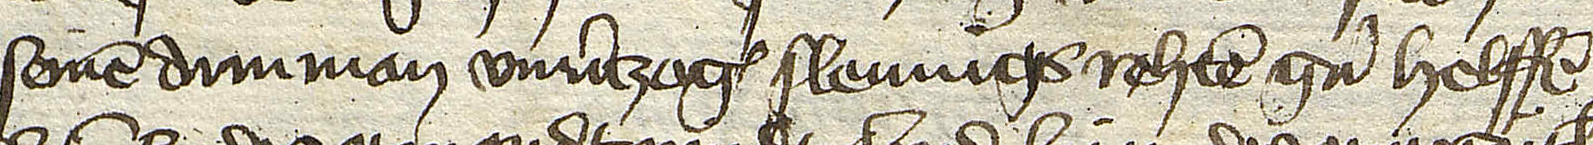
ſeine* Armman vnu*cʒog* ſleunigs rehte* gn* helffe*
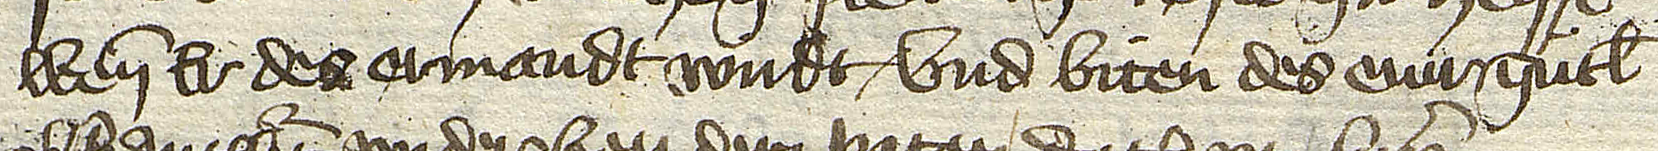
wen* Er des ermandt wirdt / vnd biten des ewr gütl*
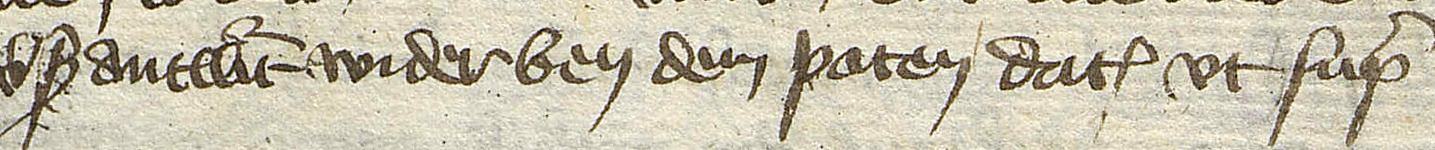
v*ſ* Antwt* wider bey dem poten dat* vt ſup*
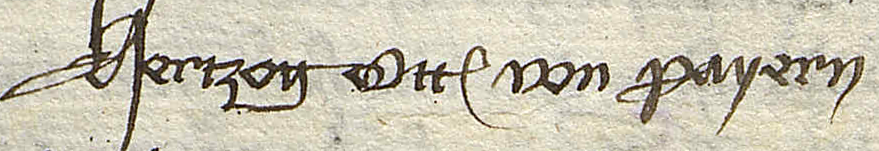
Hercʒog Ott* von Payern
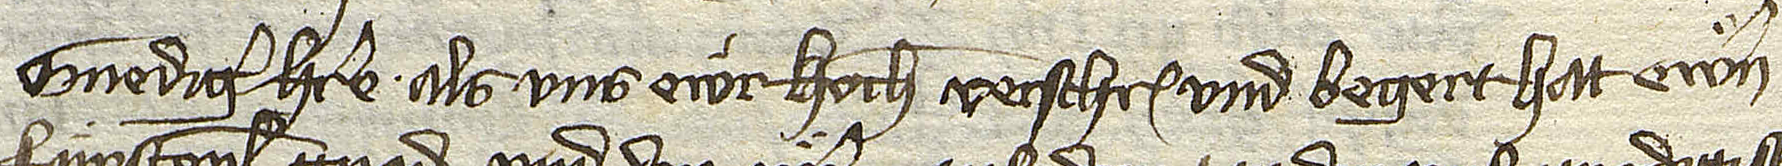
Gnedig* hr*e . als vns eẅr hoch* verſchr* vnd begert hat eẅn*
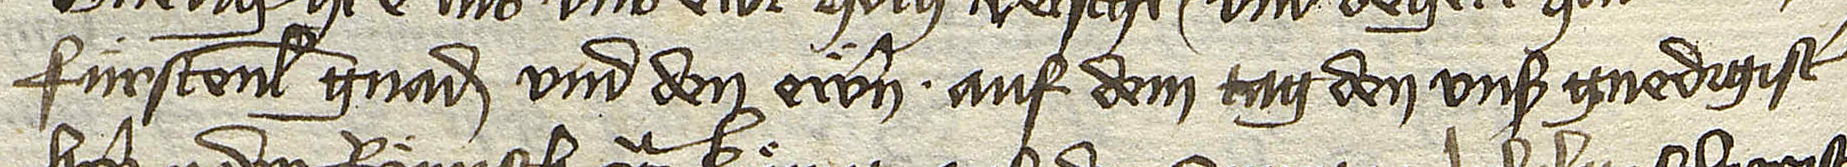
fürſtenl* gnad* vnd den eẅn* . auf dem tag den vnſ* gnedigiſt*
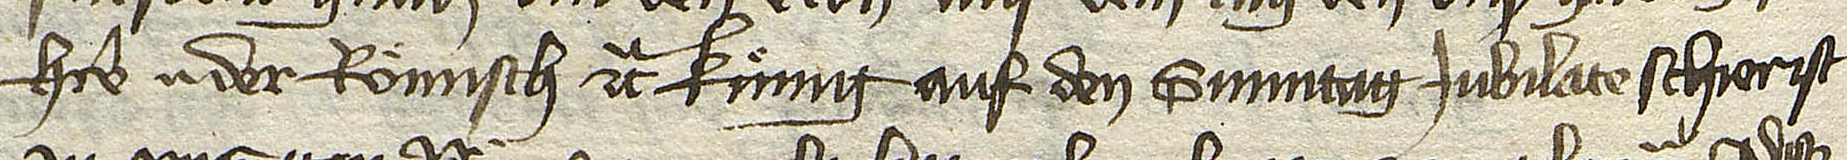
hr*e ~ der Römiſch ec* künig auf den Sunntag Iubilate ſchieriſt
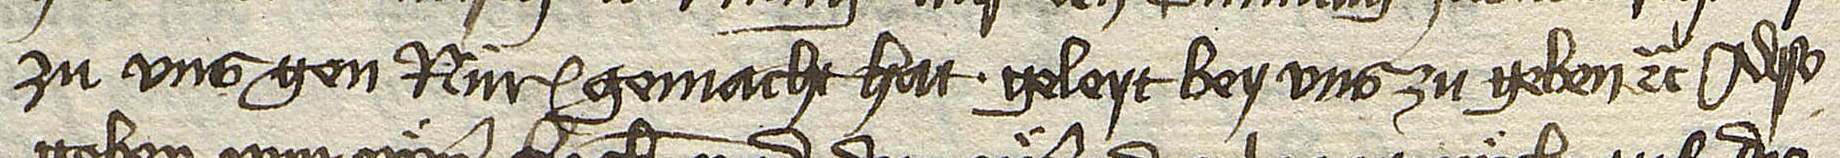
ʒu vns gen Nür* gemacht hat . geleyt bey vns ʒu geben ec* Alſo
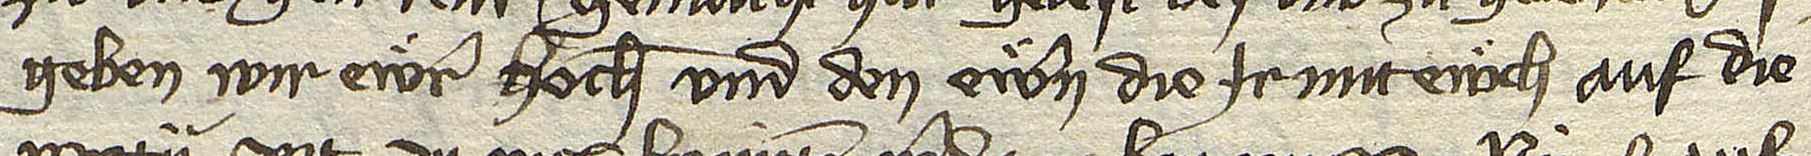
geben wir eẅr* hoch* vnd den eẅn* die Ir mit eẅch auf die
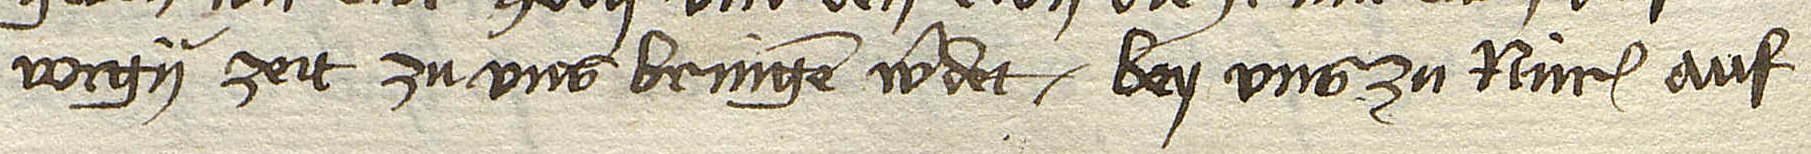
vorgn* ʒeit vns bringe* w*det / bey vns ʒu Nür* auf
